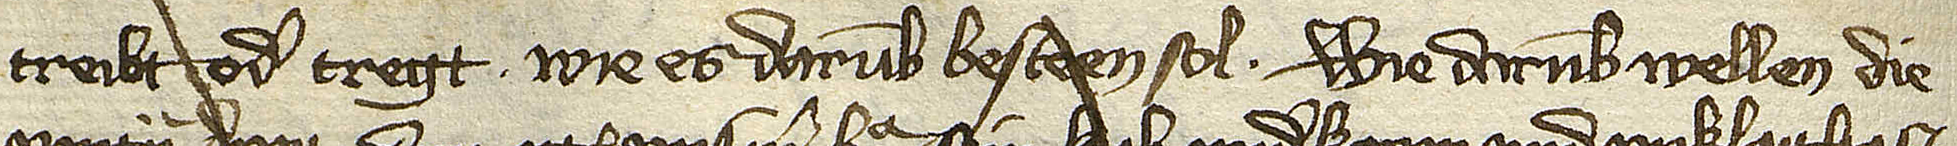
treibt od* tregt . wie es darub* beſteen ſol . Wie darub* wellen die
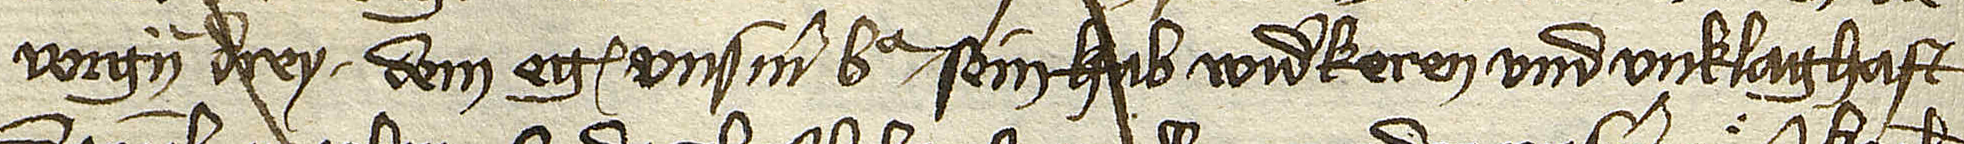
vorgn* drey / dem eg* vnſm* b* / ſein hab wid*keren vnd vnklaghaſt
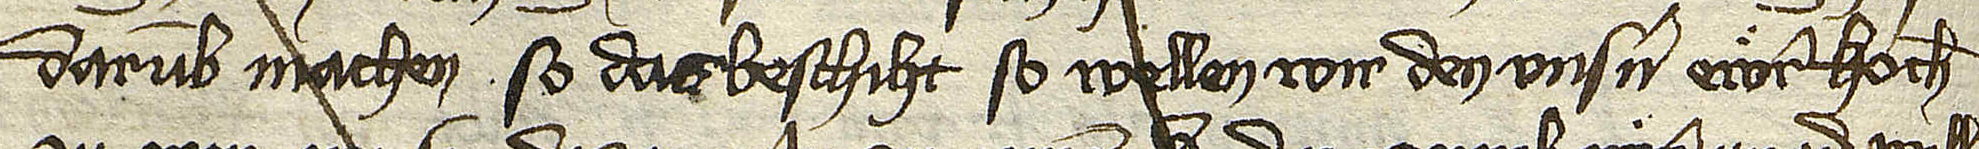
darub* machen . ſo das beſchiht ſo wellen wir den vnſn* ewr* hoch*
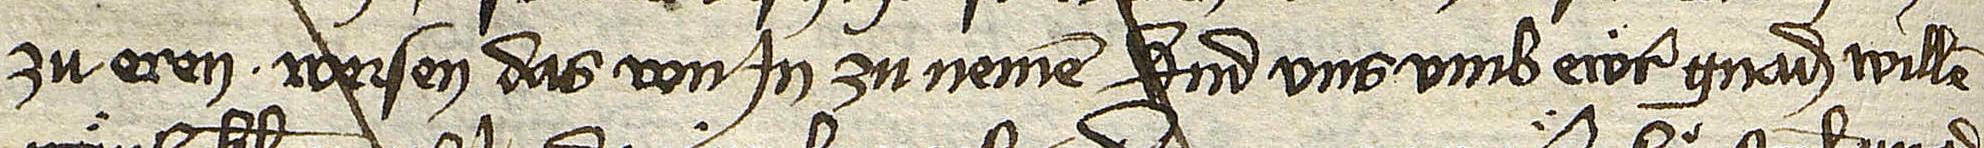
ʒu eren . weiſen das von In ʒu neme* Vnd vns vmb ewr gnad* wille*
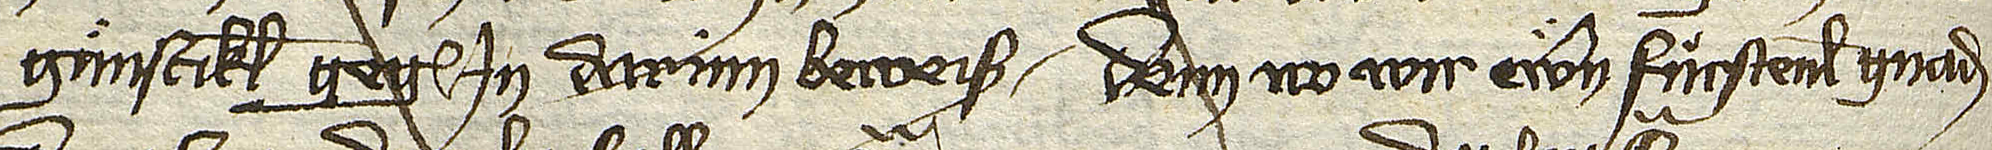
günſtikl* geg* In darinn beweiſ* / Denn wo wir ew*n fürſtenl* gnad*
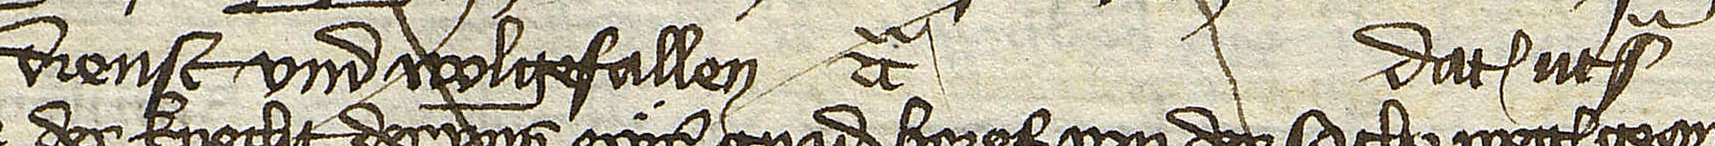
dienſt vnd wolgefallen ec* dat* ut ſ*
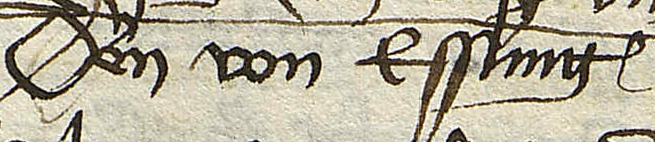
Den von Eſſling*
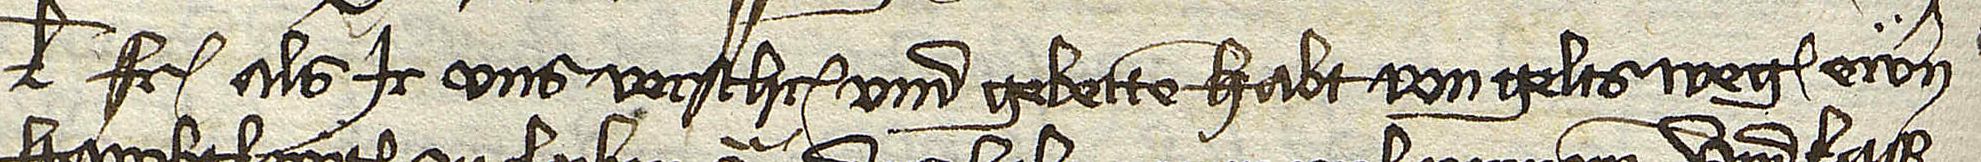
L* Fr* als Ir vns verſchr* vnd gebette* habt von gelts weg* ew*n
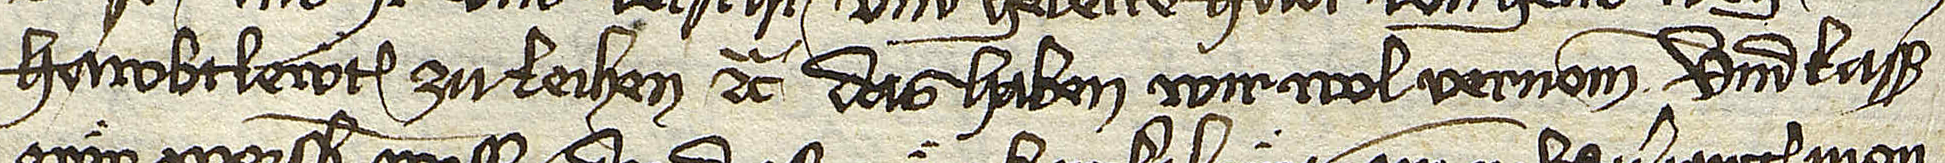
hawbtlewt* ʒu leihen ec* das haben wir wol vernom* . Vnd laſſ*
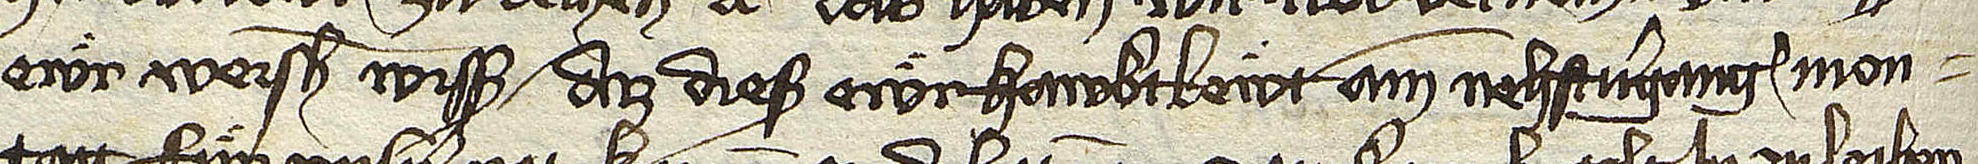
ewr weiſh* wiſſ* / daʒ dieſ* ewr hawbtbewt* am* nehſtu*gang* mon =
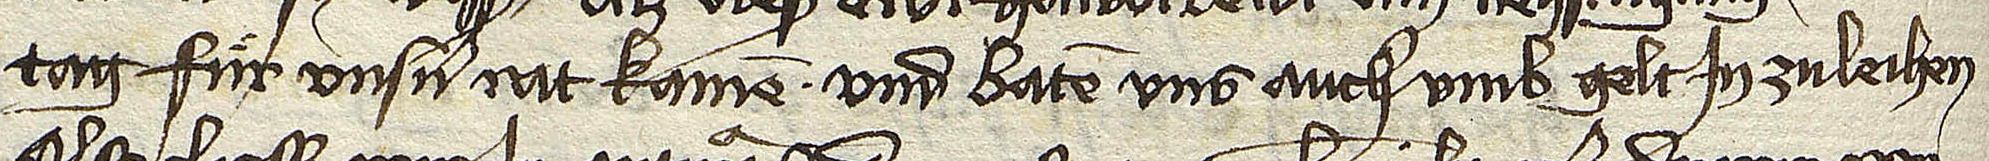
tag für vnſn* rat kame* . vnd bate* vns auch vmb gelt In ʒuleihen
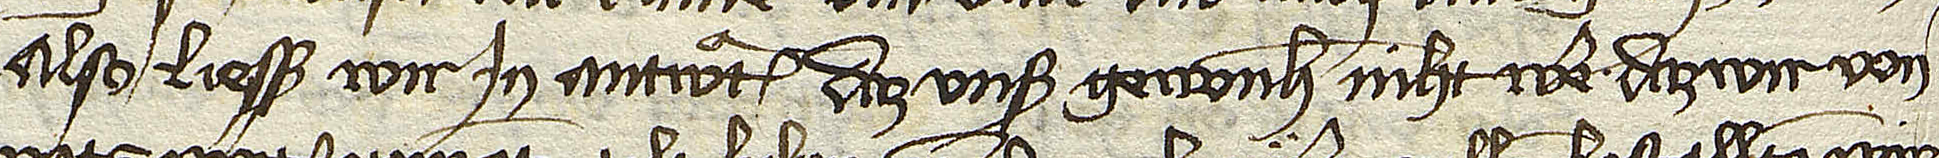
Alſo lieſſ* wir In antw*t* daʒ vnſ* gewonh* niht we* . daʒ wir von
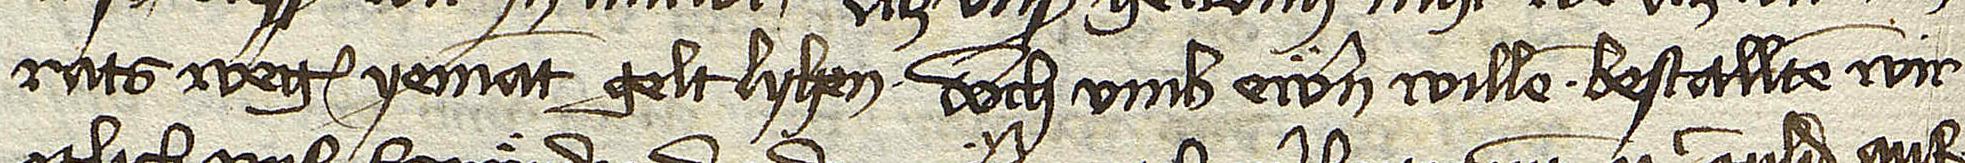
rats weg* yema*t gelt lyhen . Doch vmb ew*n wille* . beſtallte* wir
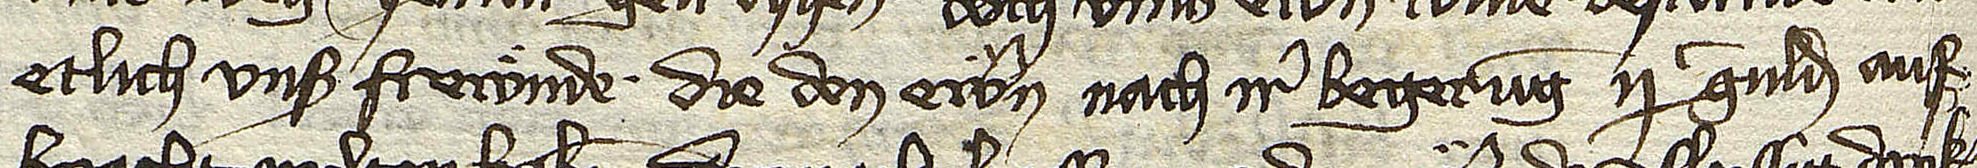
etlich vnſ* frewnde . die den ew*n nach ir* beger*ug ii* guld* auf
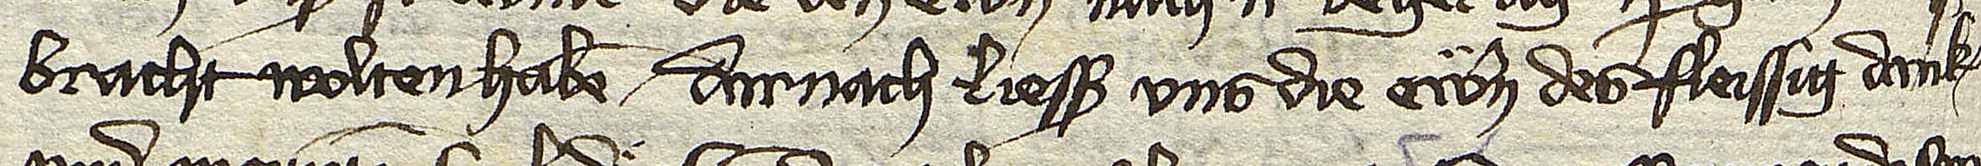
bracht wolten habe* / darnach lieſſ* vns die ew*n des fleiſſig dank*
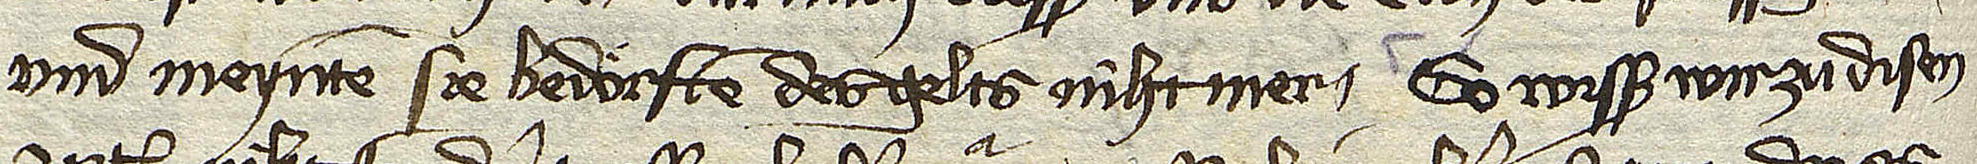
vnd meynte* ſie bedörfte* des gelts niht mer / So wiſſ* wir ʒu diſen
